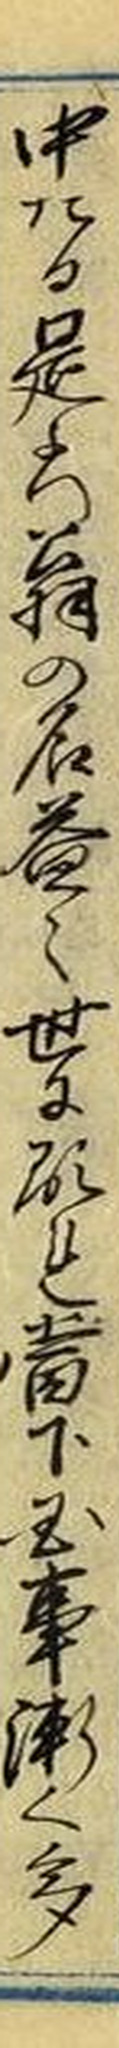申たる是より翁の名益々世に顕れ当下国事漸く多
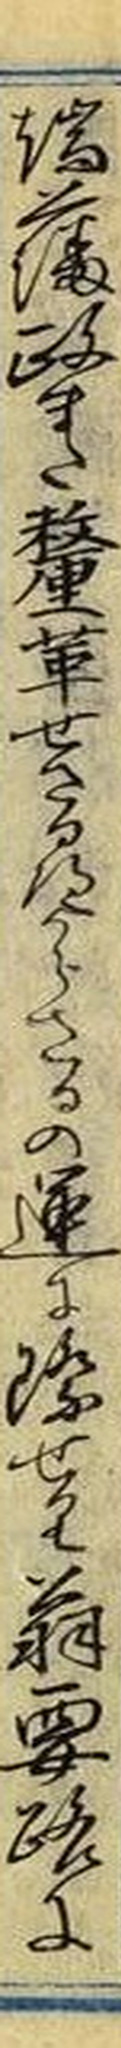端藩政また釐革せさるへからさるの運に際せり翁要路に
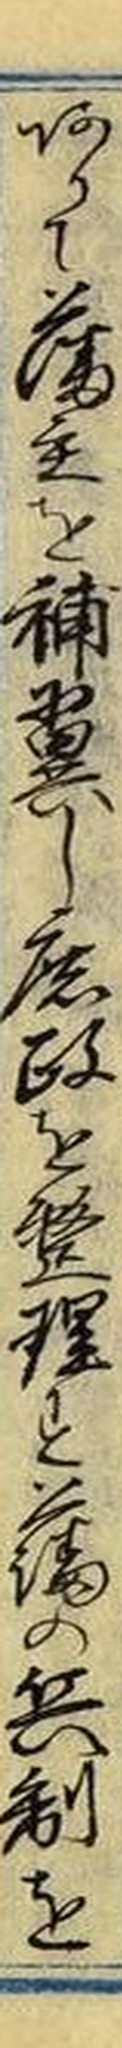ありて藩主を補翼し庶政を整理す藩の兵制を
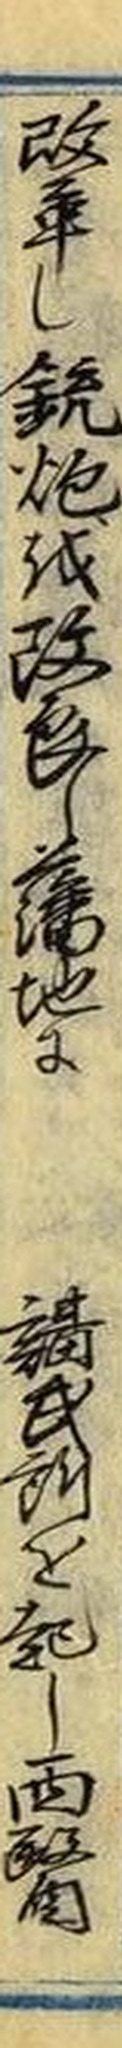改革し銃炮を改良し藩地に講武所を起し西医
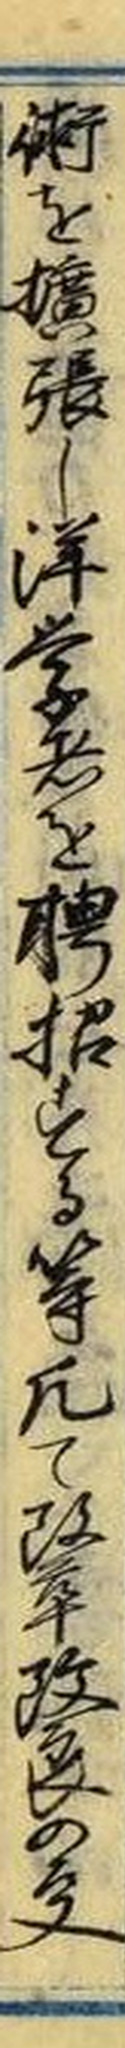術を拡張し洋学者を聘招する等凡て改革改良の事

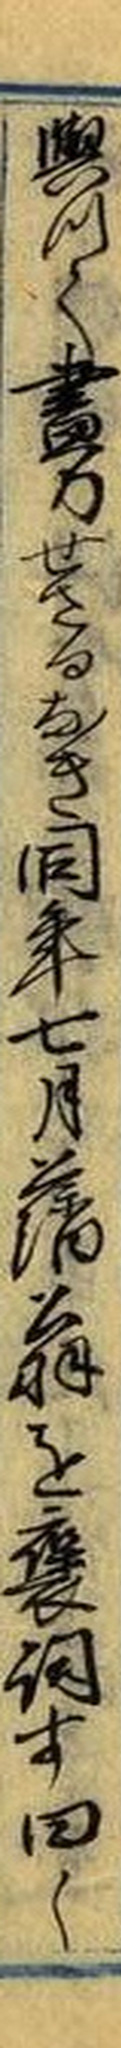興つて尽力せさるなき同年七月藩翁を褒詞す曰く
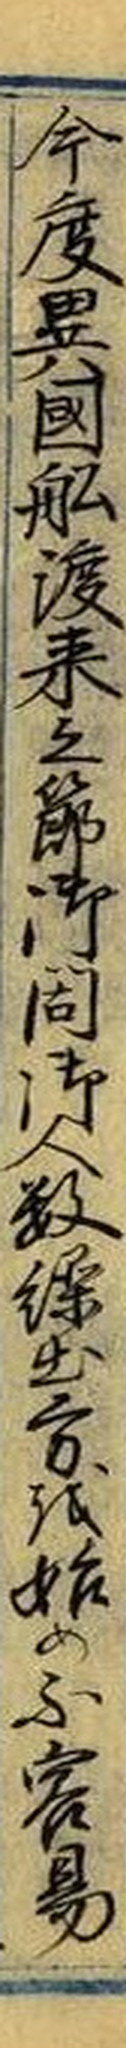今度異国船渡来之節御固御人数繰出方を始め不容易
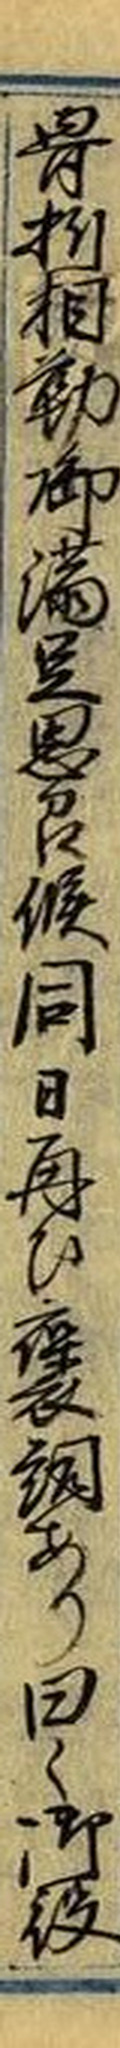骨折相勤御満足思召候同日再ひ褒詞あり曰く御役
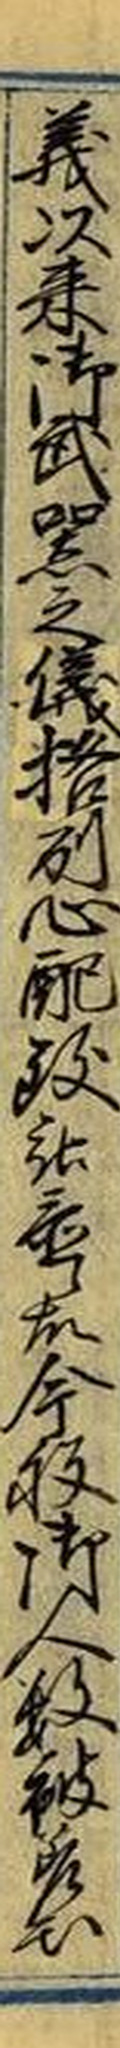義以来御武器之儀格別心配致被置候故今般御人数被差出
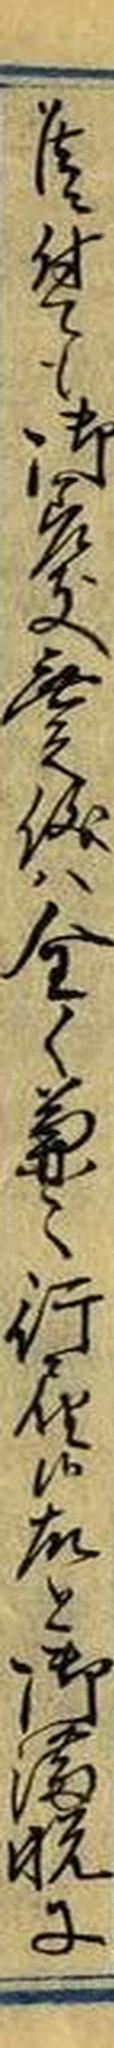候ニ付ても御差支無之儀ハ全く兼々行届候故と御満悦に
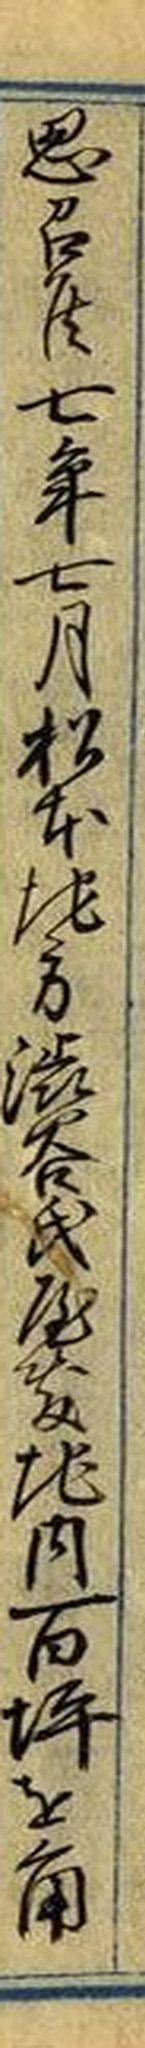思召候七年七月松本地方渋谷氏屋敷地内百坪を角
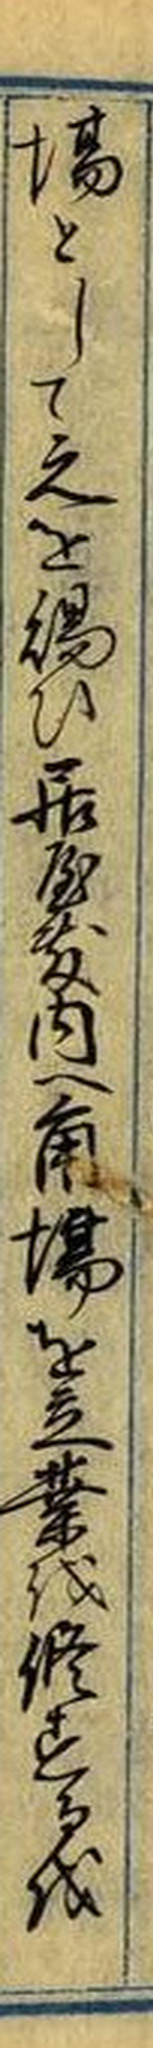場として之を賜ひ居屋敷内へ角場を立業を修するを
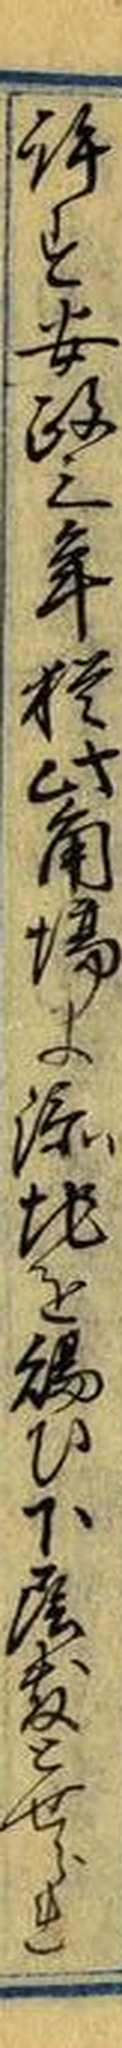許す安政三年猶此角場に添地を賜ひ下屋敷とせられ
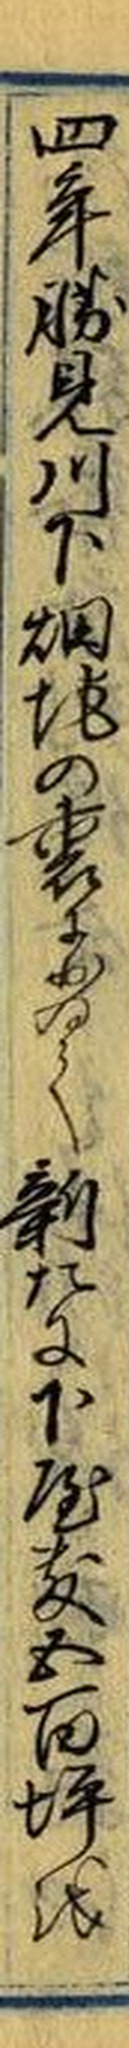四年勝見川下畑地の裏におゐて新たに下屋敷五百坪を
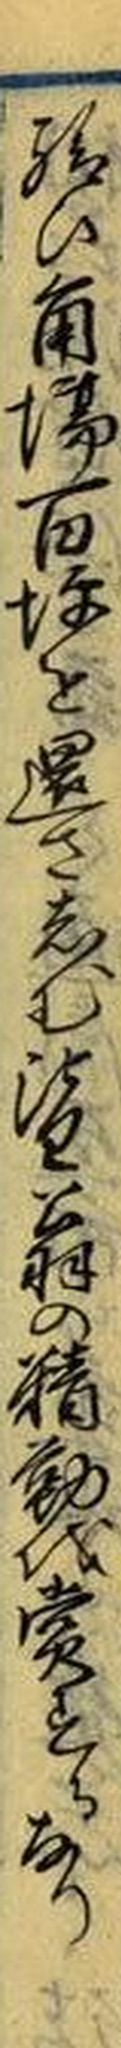給ひ角場百坪を還さしむ皆翁の精勤を賞するなり
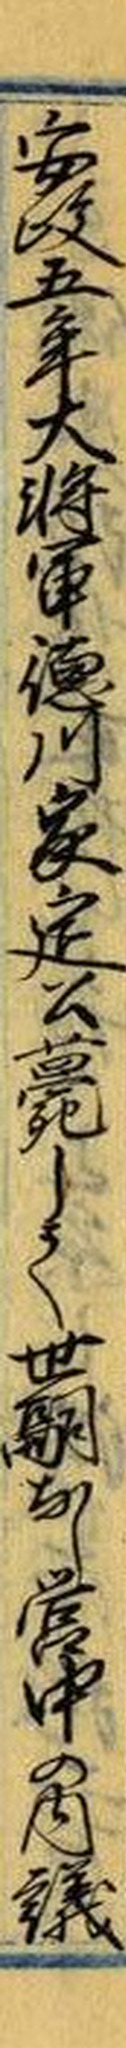安政五年大将軍徳川家定公薨して世嗣なし営中の内議
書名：温古集 三巻
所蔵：福井県文書館 Fukui Prefectural Archives
